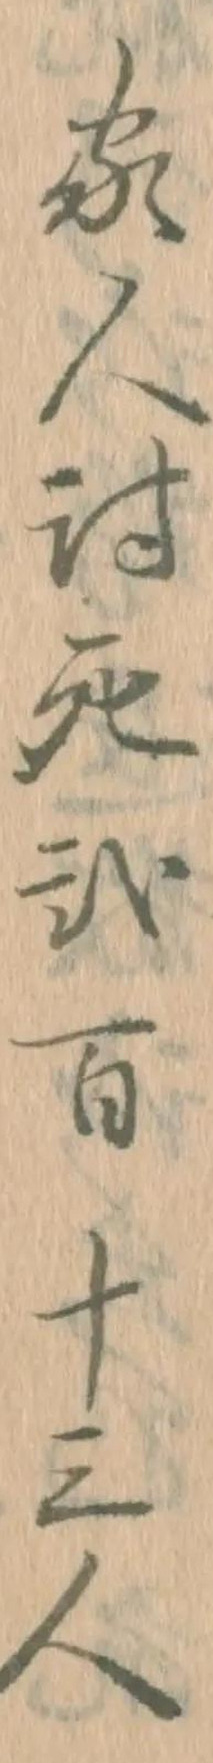家人討死弐百十三人
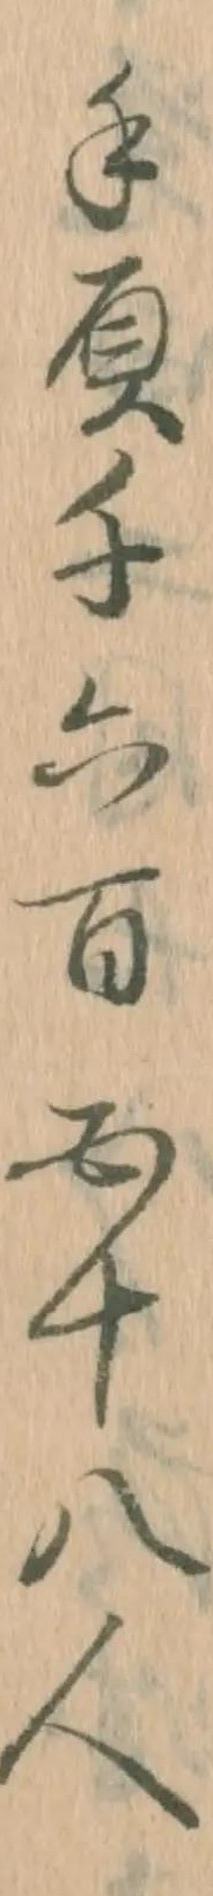手負千六百五十八人
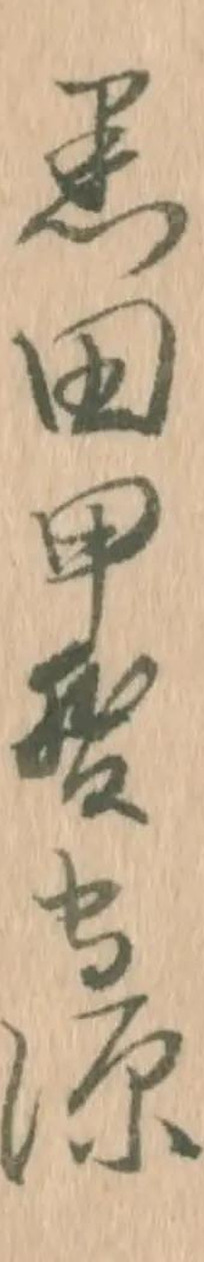黒田甲斐守源
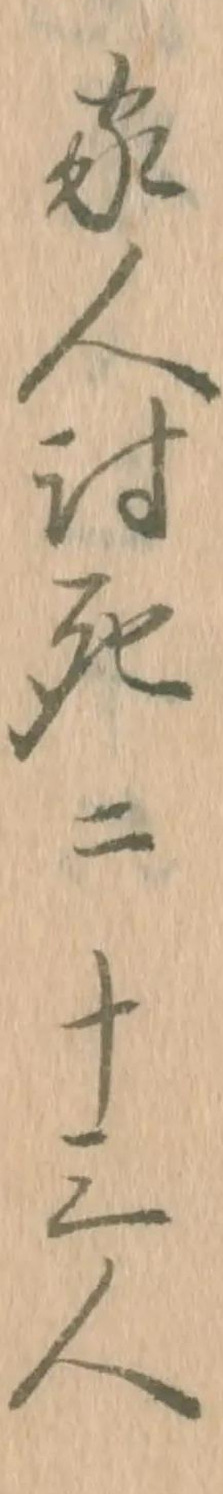家人討死二十三人
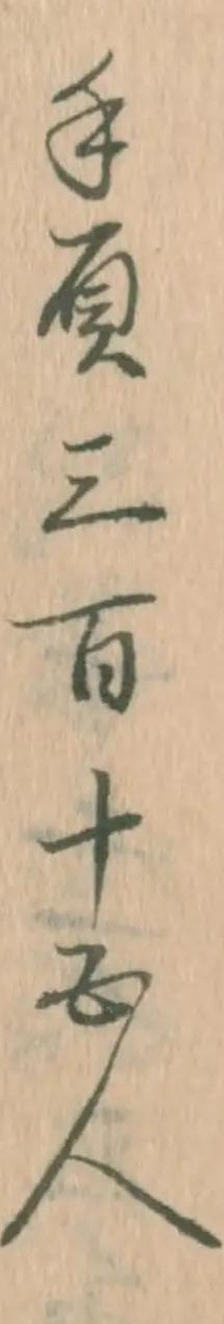手負三百十五人
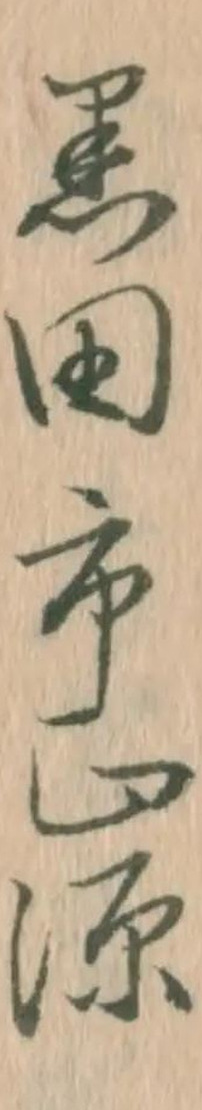黒田市正源
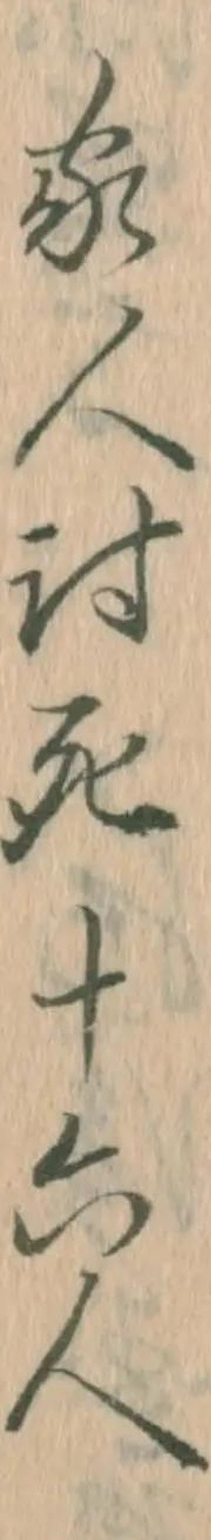家人討死十六人
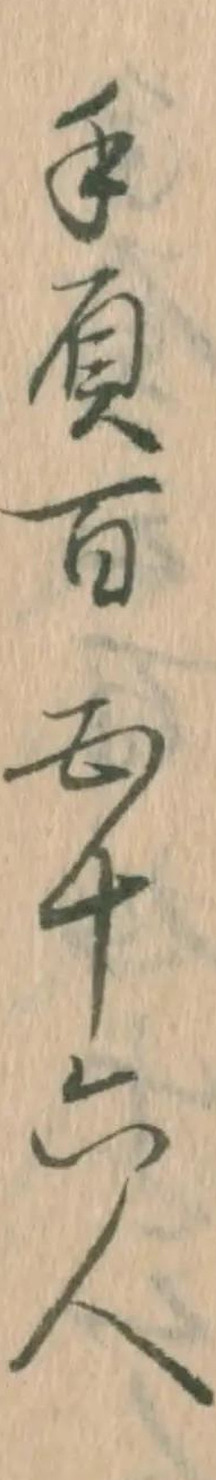手負百五十六人
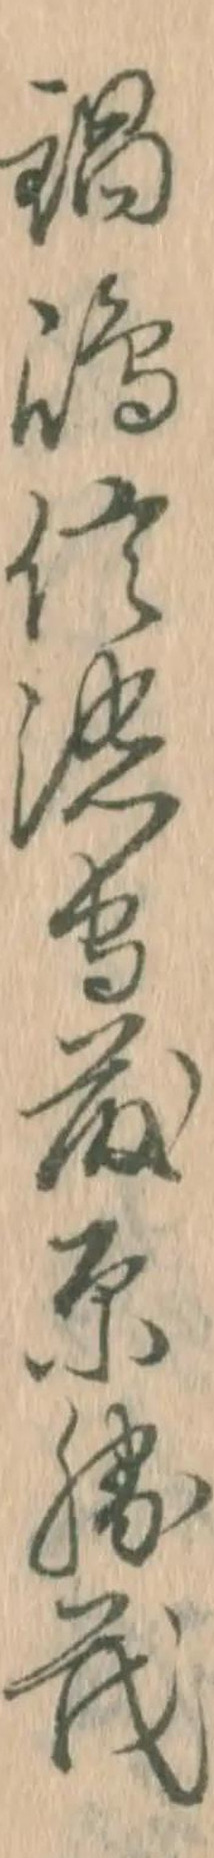鍋島信濃守藤原勝茂
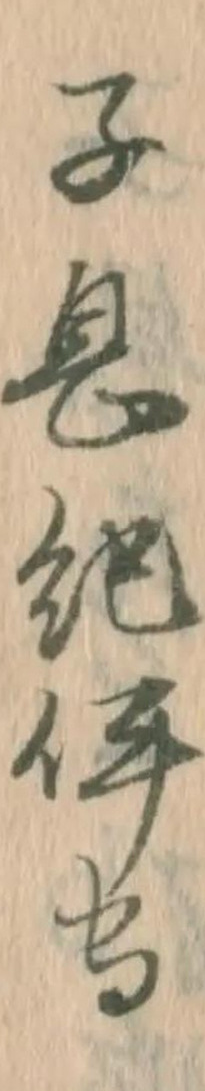子息紀伊守
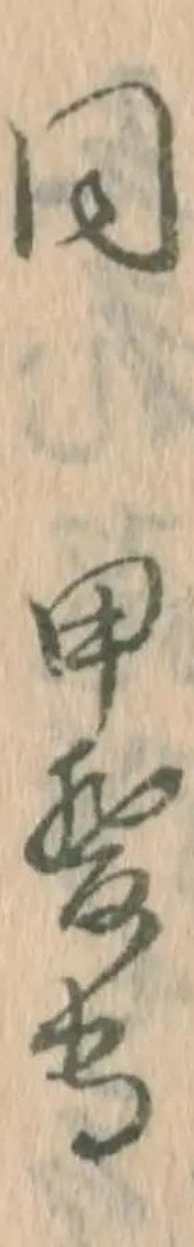同甲斐守
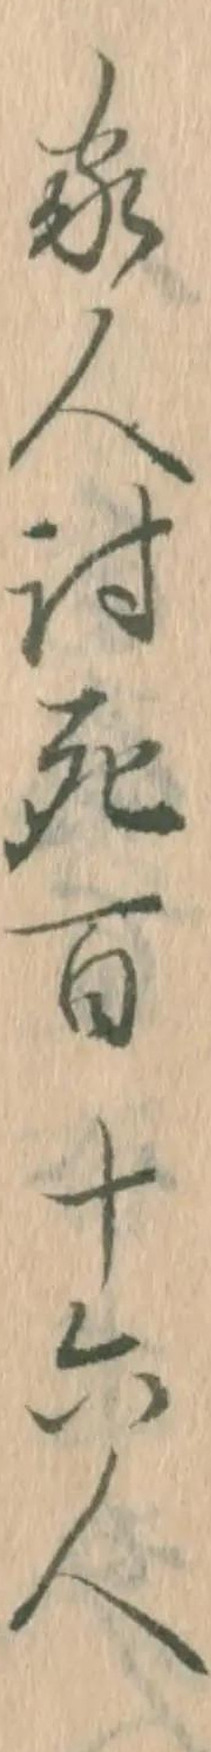家人討死百十六人
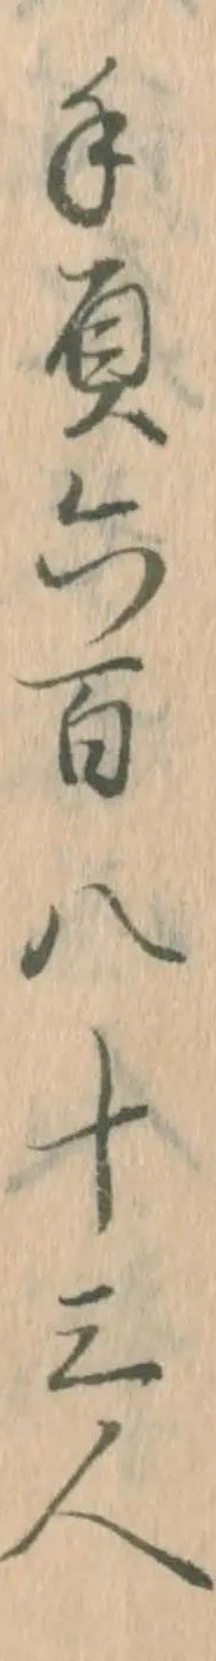手負六百八十三人
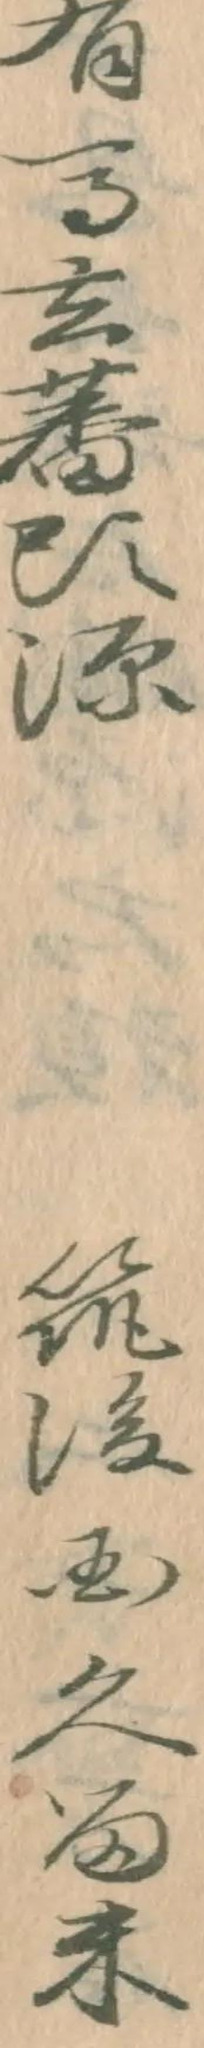有馬玄蕃頭源筑後国久留米

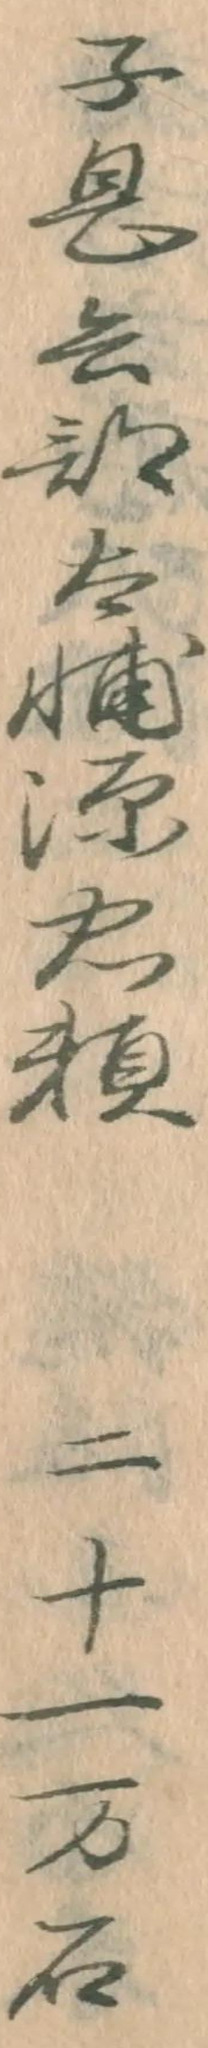子息兵部太輔源忠頼二十一万石
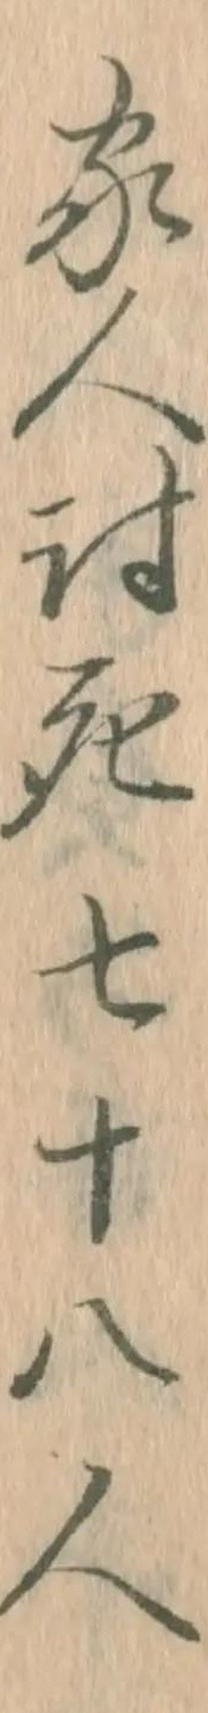家人討死七十八人
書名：切支丹御退治記 49巻. [9]
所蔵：国立国会図書館 National Diet Library, JAPAN
